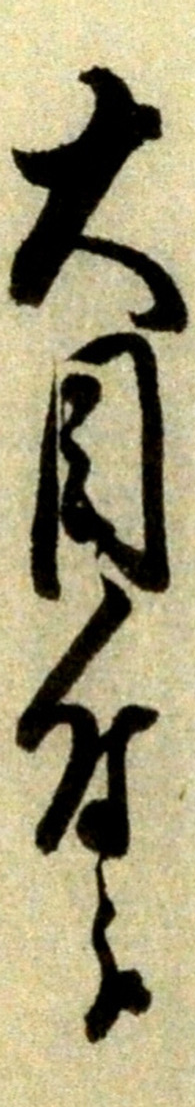大目付え
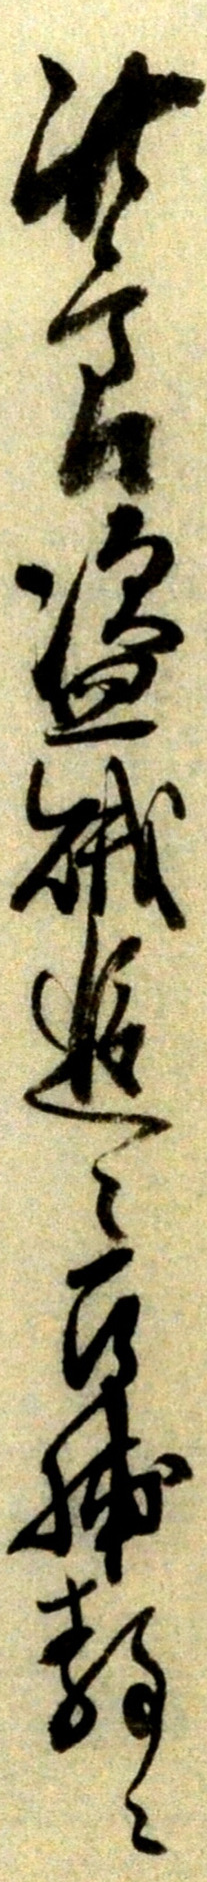此節盗賊追々召捕静に
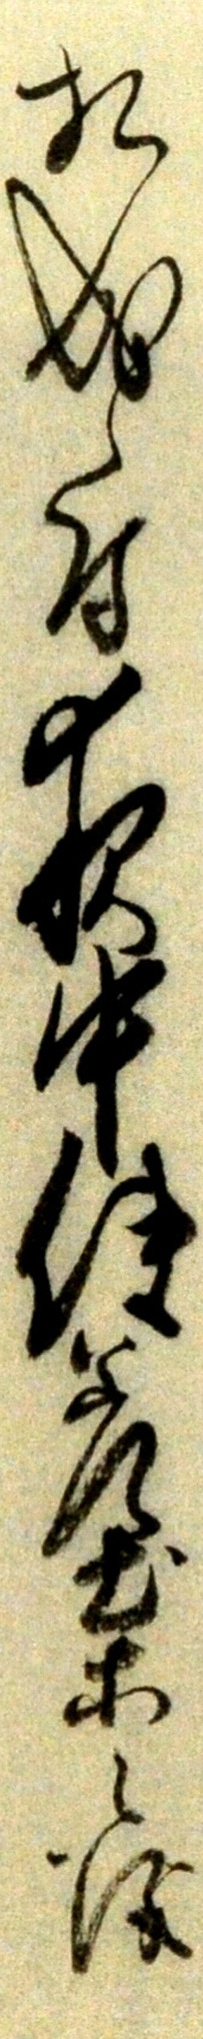相成候付夜中使差出等之義
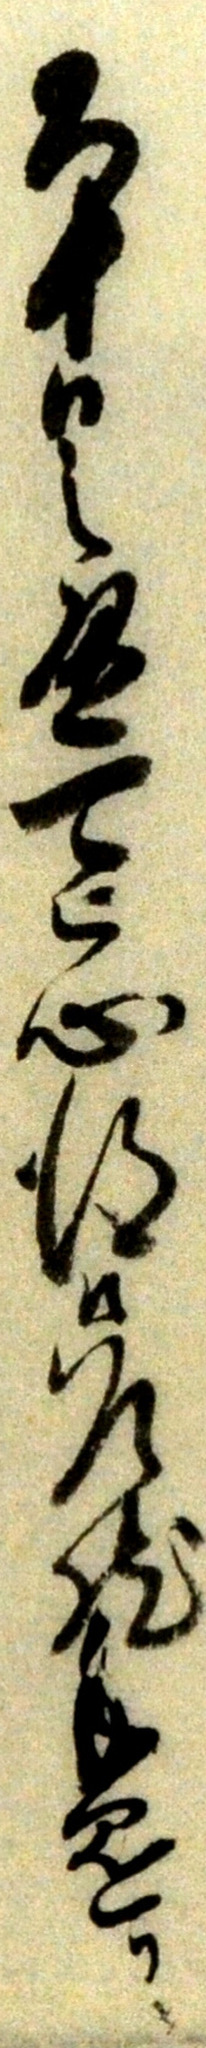平日之通可被心得候乍然手懸り
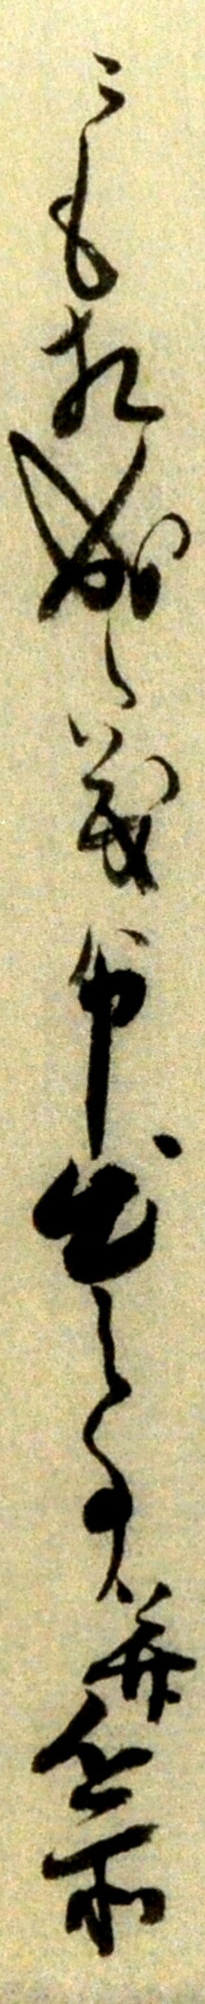にも相成候義は申出之事幷近所

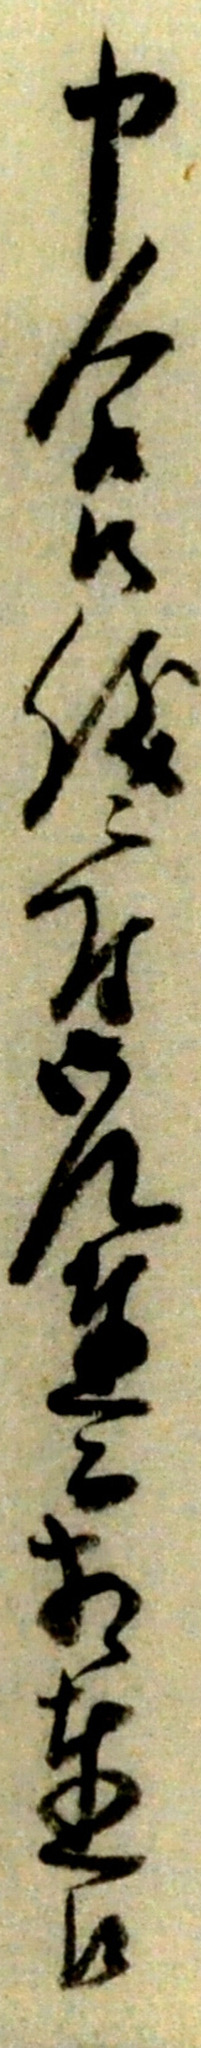申合候儀に付先達而相達候
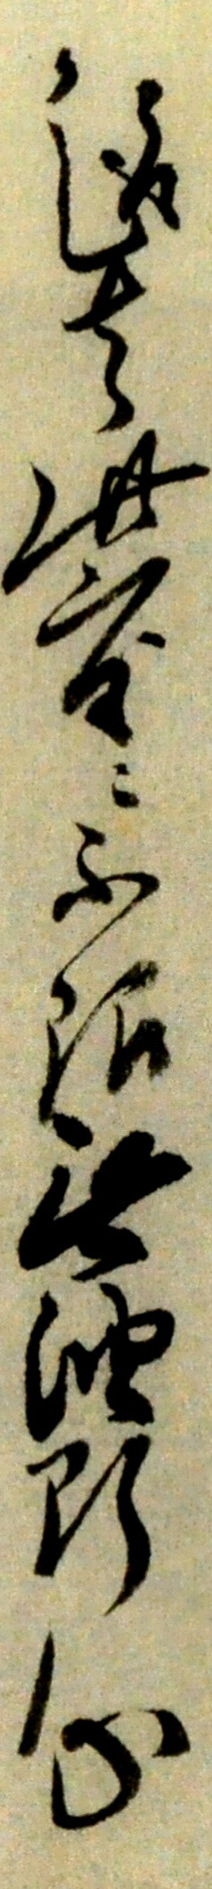趣は此度に不限無油断心
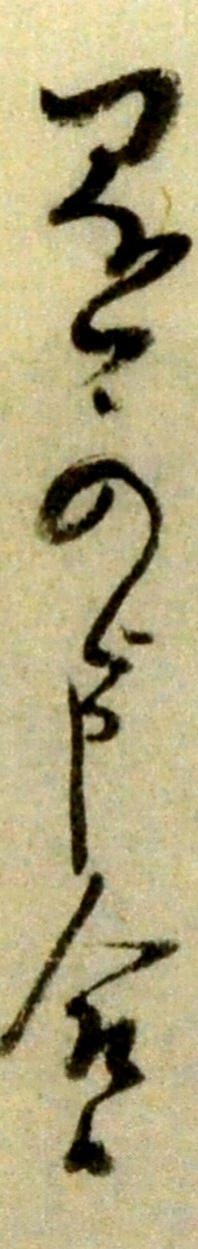懸可被申合候
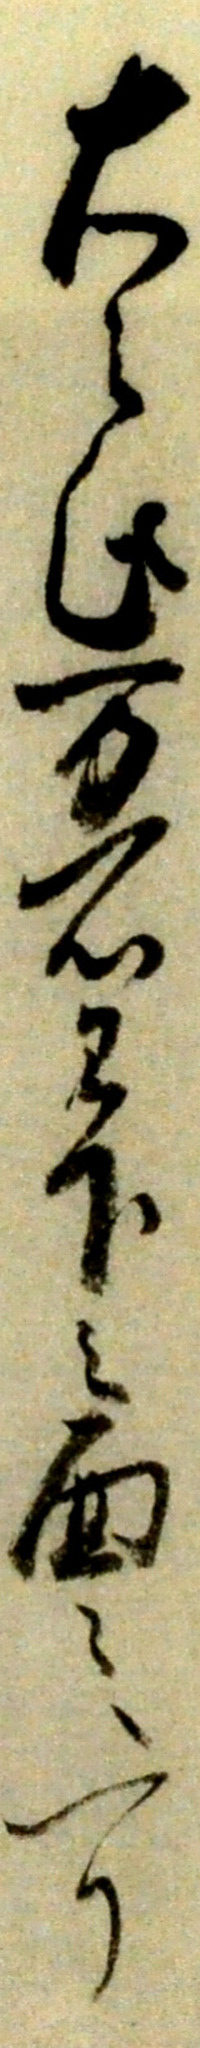右之趣万石已下之面々へ可
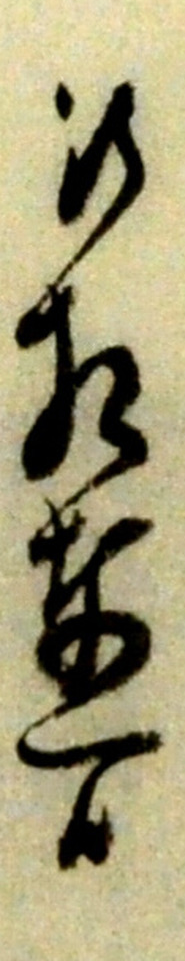被相達候
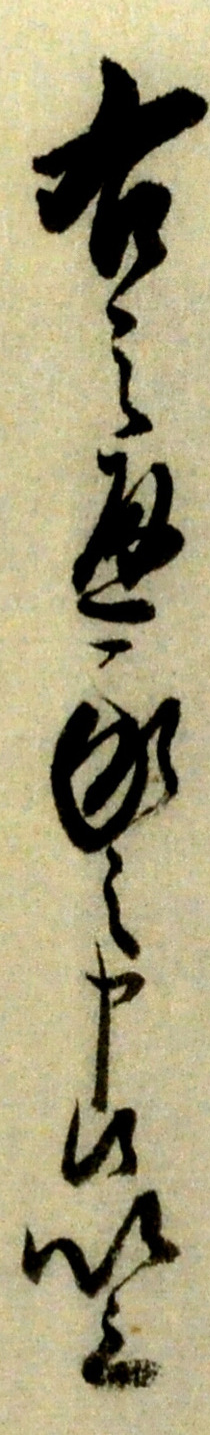右之通承之申候以上
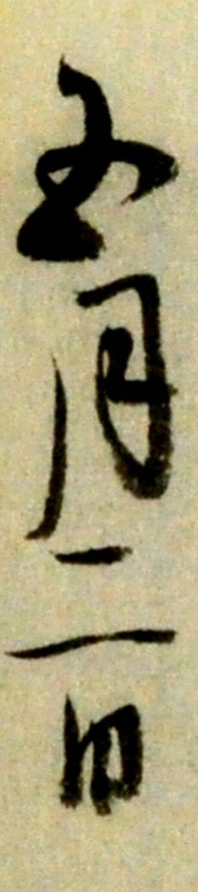五月二日
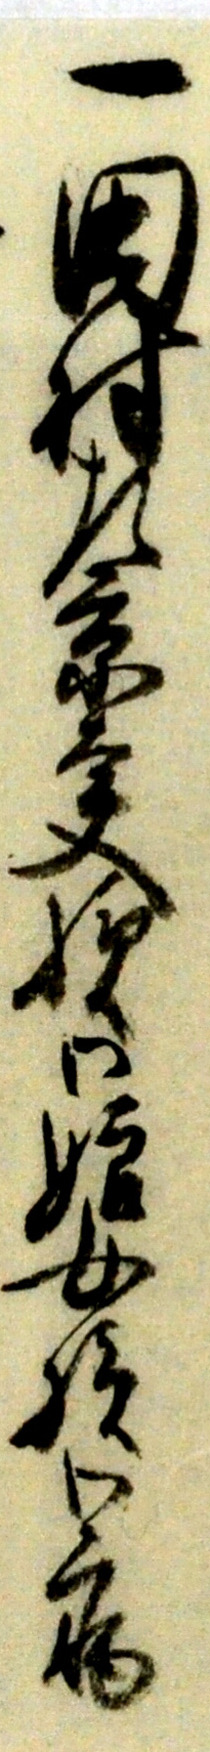一田村左京太夫様御娘女様御病
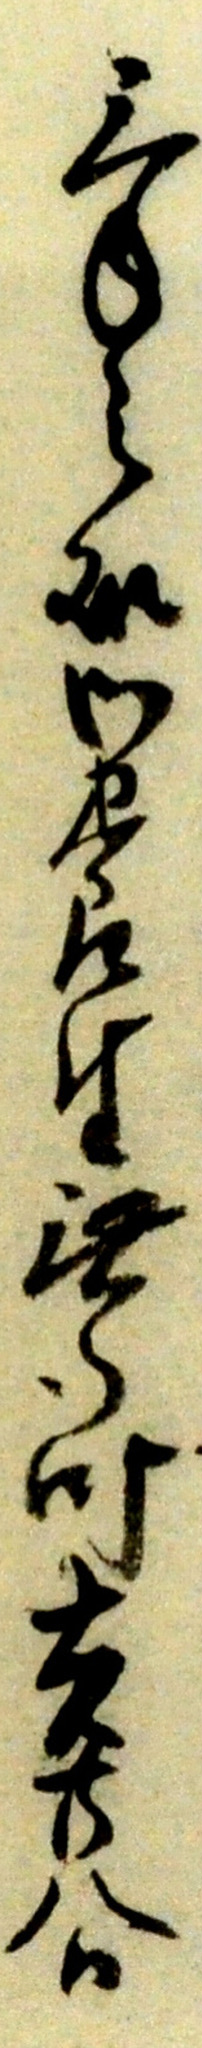気之処御養生無御叶去廿八日
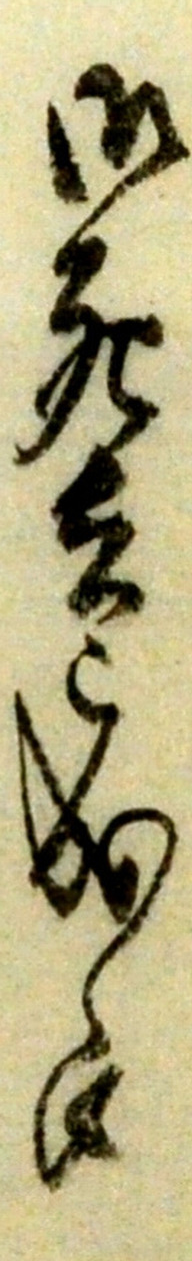御死去被成候由
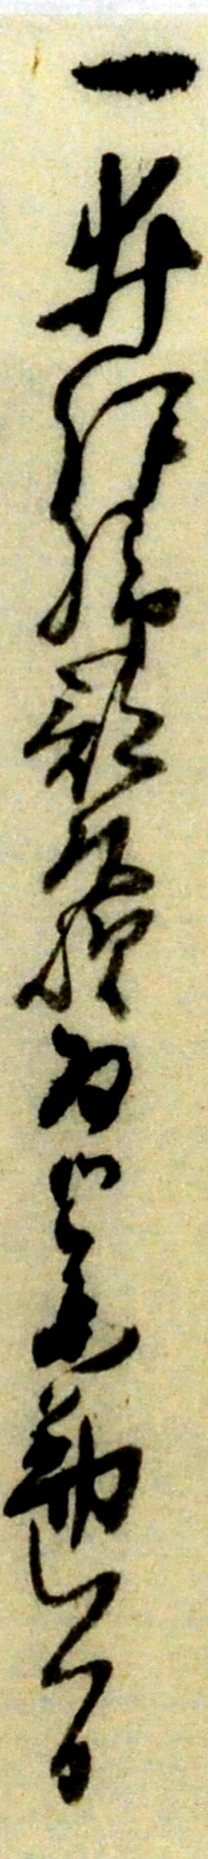一井伊掃部頭様為御参勤今日
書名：申合帳〔一括〕
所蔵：伊那市立高遠町図書館・合同会社AMANE
